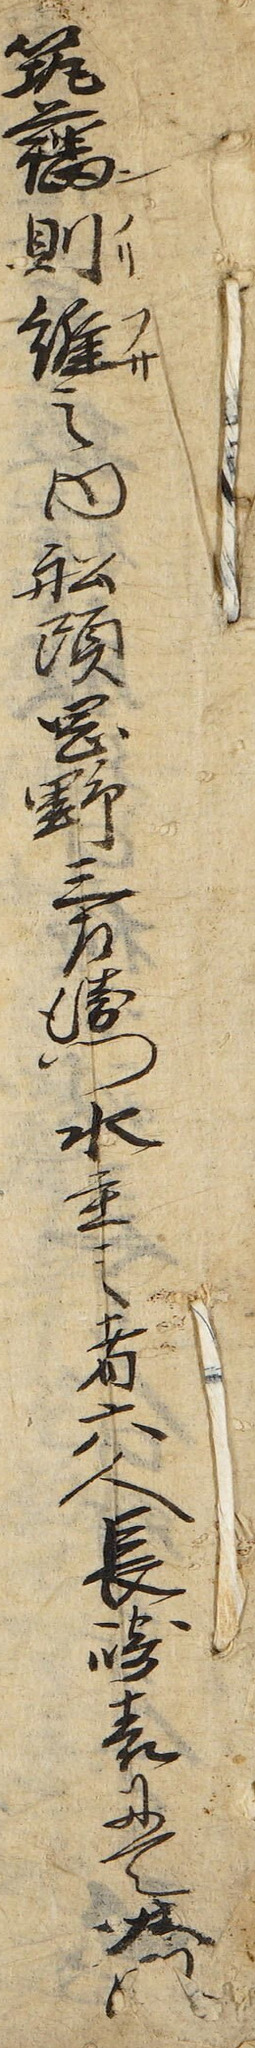筑藩則維之内船頭岡野三左衛門水主之者六人長崎表にて
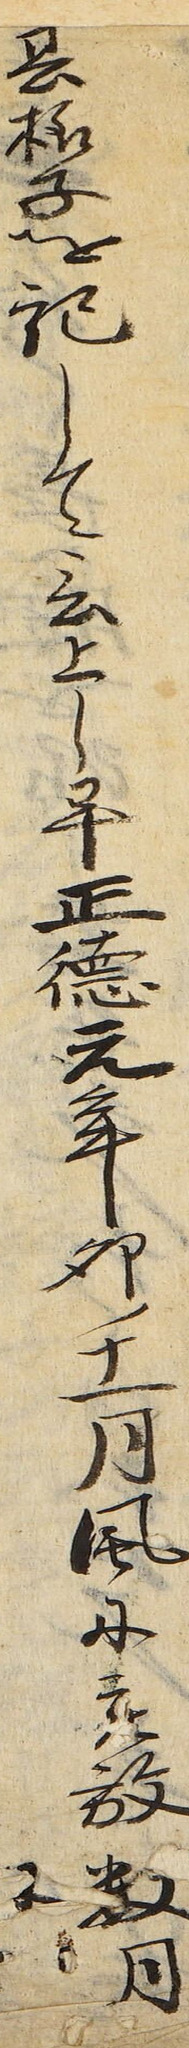其様子を記して言上し畢正徳元年卯ノ十一月風に被放数月
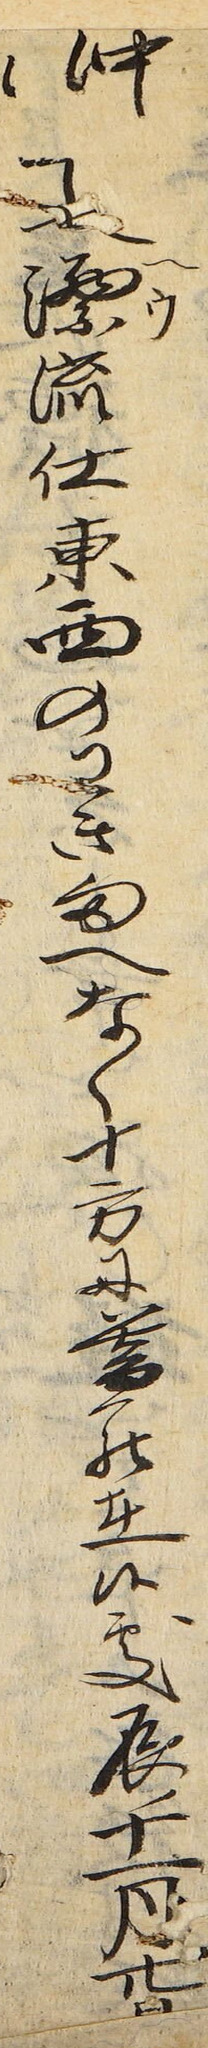沖漂流仕東西のわきまへなく十方に暮罷在候処辰ノ十一月廿日
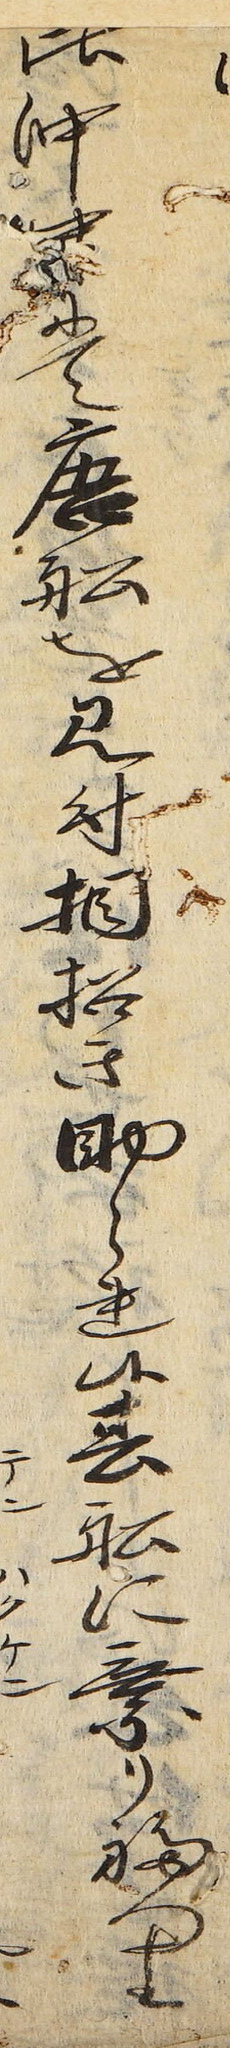頃沖にて唐船を見付相招き助られ候其船に乗り移り
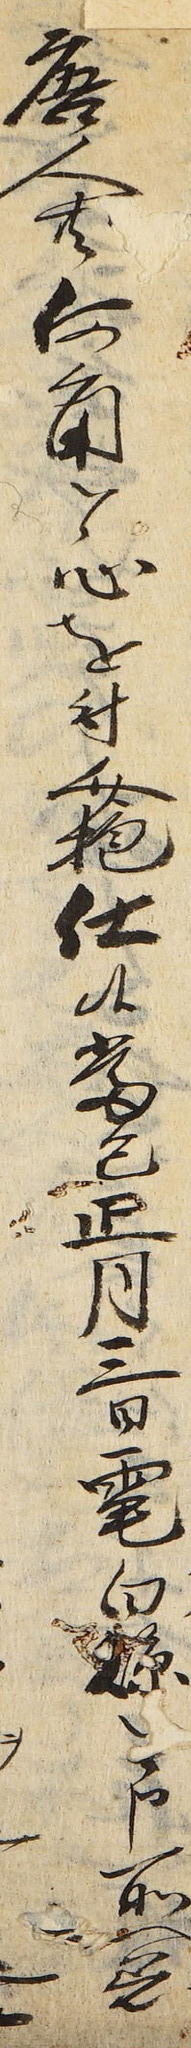唐人共何角と心を付介抱仕候当巳正月三日電白県と申所へ着
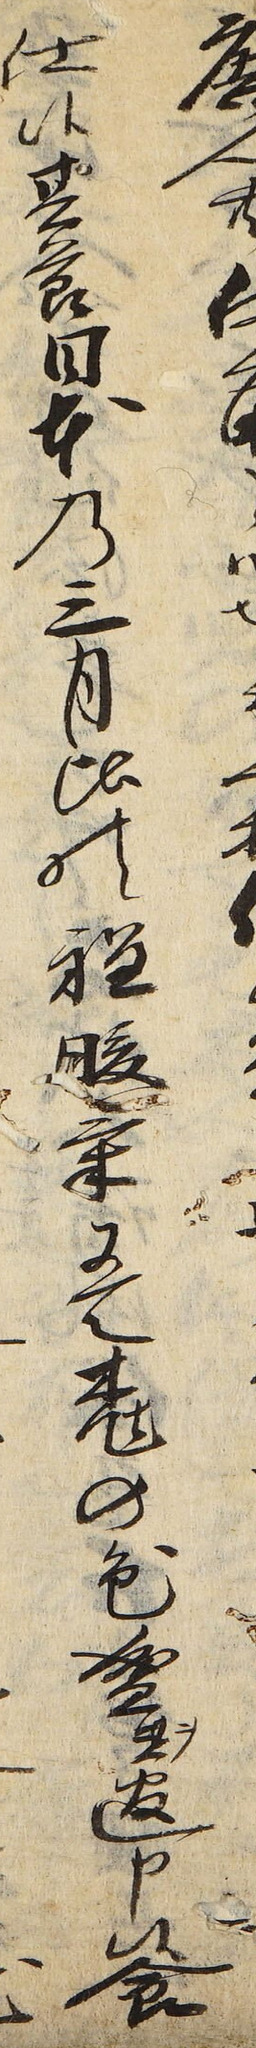仕候其節日本の三月頃の程暖気にて桃の花盛ヲ過申候食
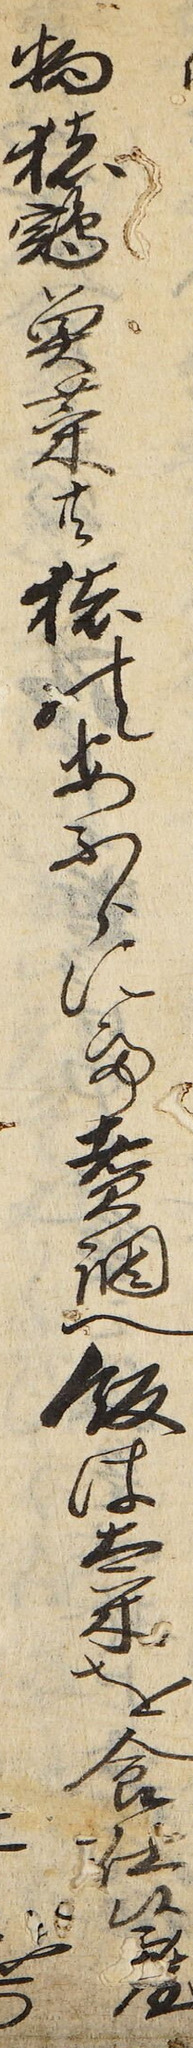物猪鶏魚菜共猪のあふらにて煮調へ飯は太米を食仕候台
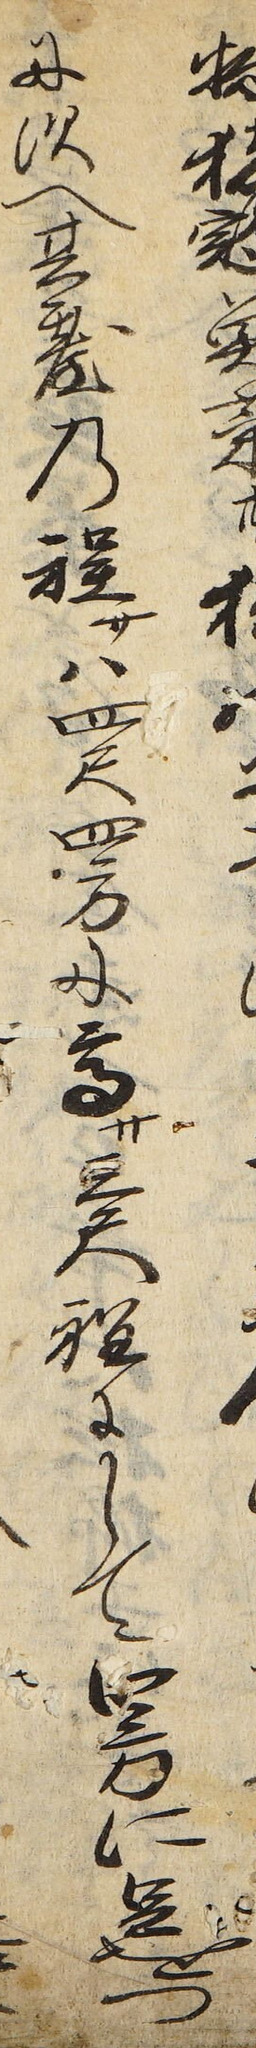にすへ其台の程サは四尺四方に高サ三尺程にして四方に足をつ
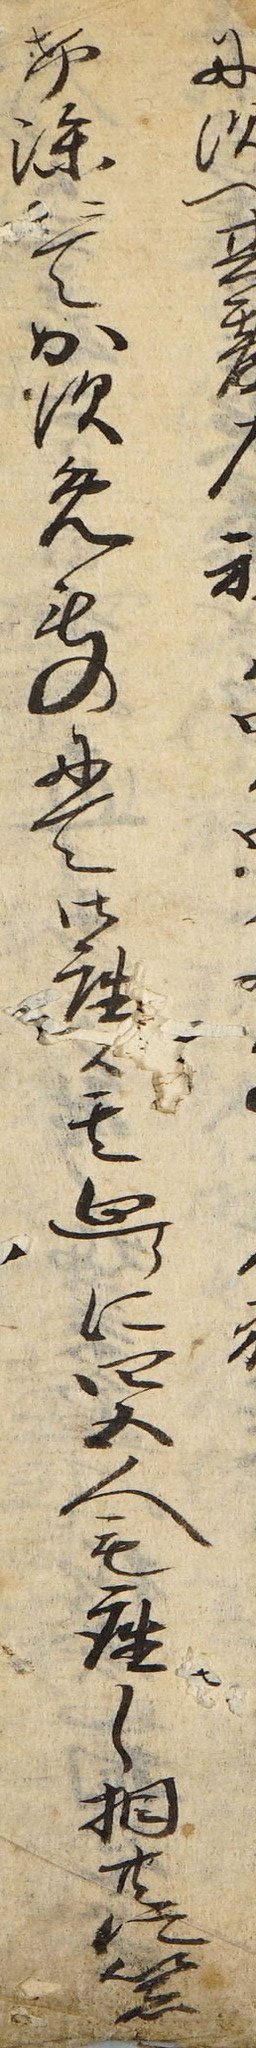け漆にてかすめものにて御座候其廻りに四五人も座し相共に器
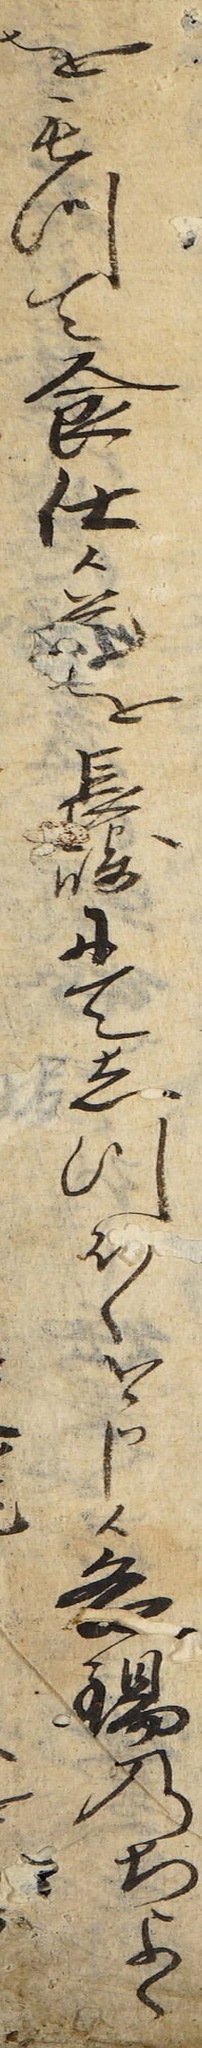をもつて食仕候是を長崎にてしつほくと申候各錫のちよく
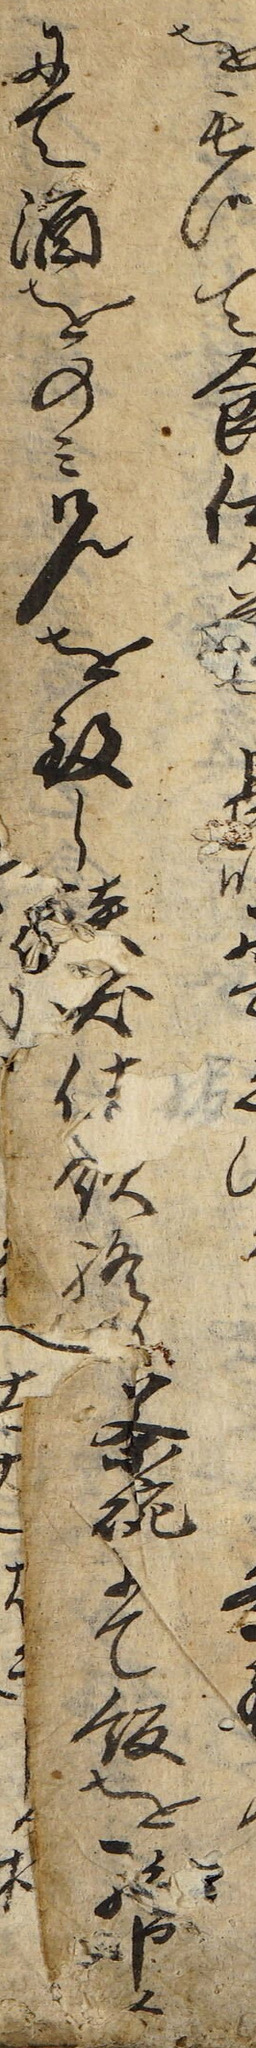にて酒をのみけんを致し談笑仕飲終り茶碗にて飯を給申候

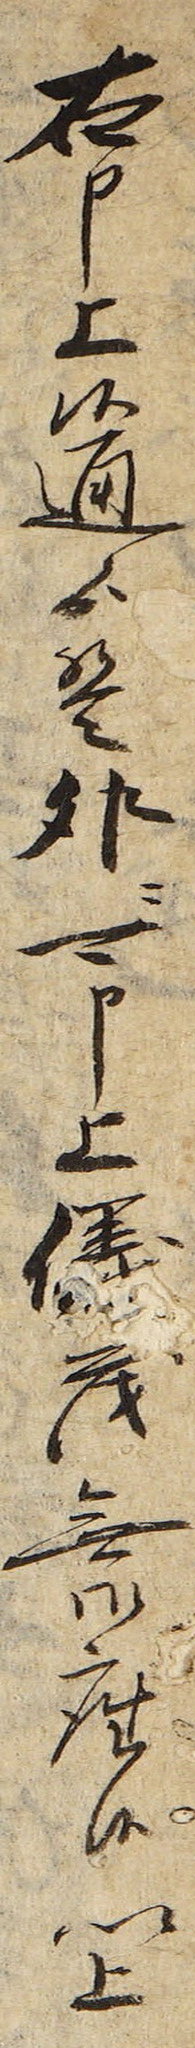右申上候通ゟは外に可申上儀も無御座候以上
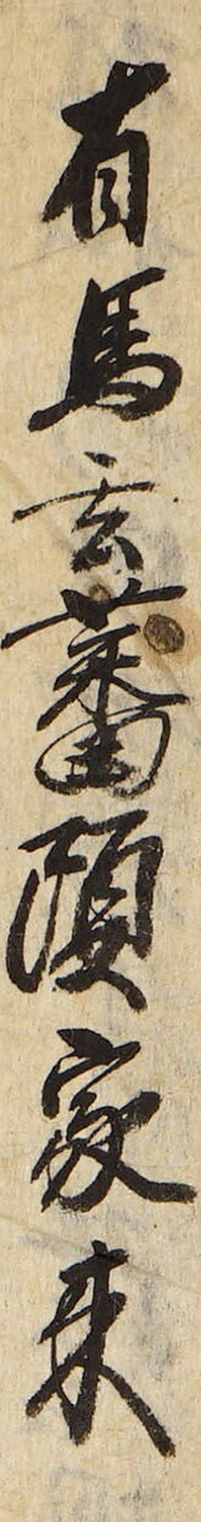有馬玄蕃頭家来
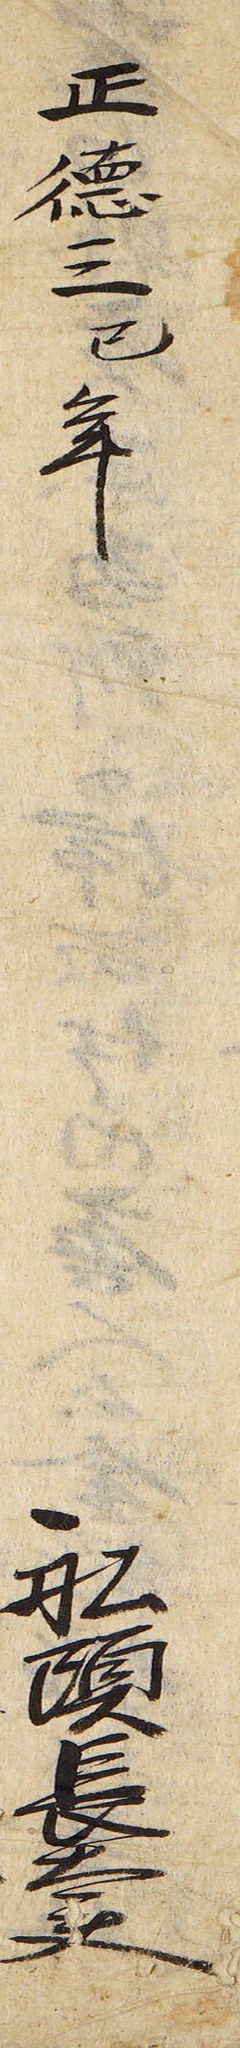正徳三巳年船頭長太夫
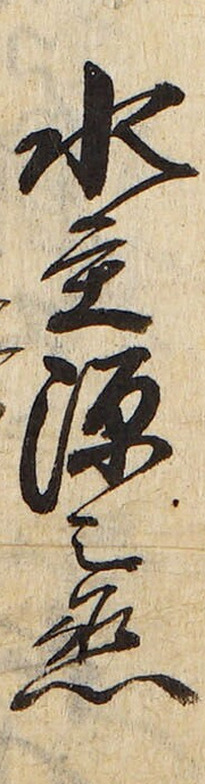水主源之丞
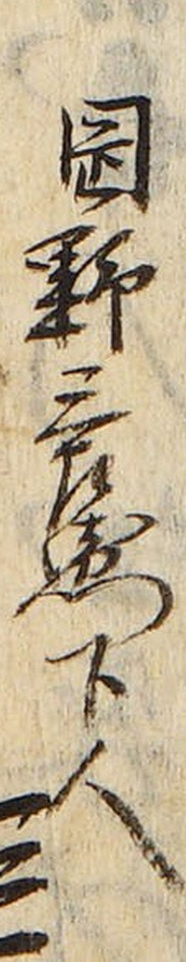岡野三左衛門下人
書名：漂流記
